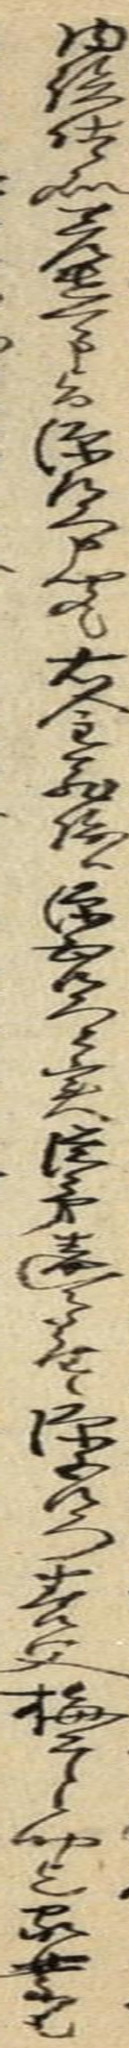内談仕候処差遣可申旨源左衛門申聞候右金蔵儀ハ源五左衛門と実従弟違ニ御座候源五左衛門養父梅干之助迄家業も
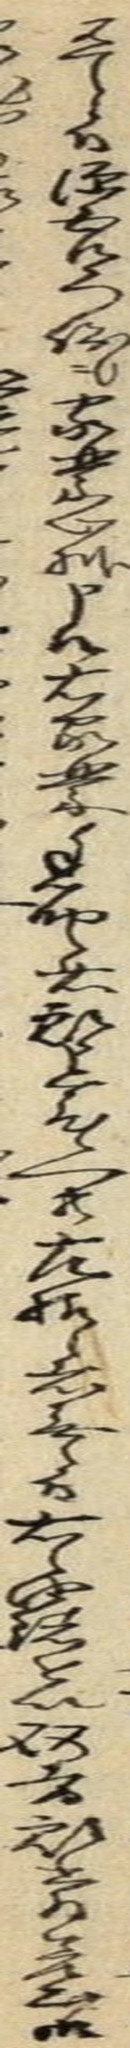有之ニ付源五左衛門儀も家業心掛申候右家業手筋之者願申上度候へ共左様之者無之ニ付右之由緒を以双方願書付差出御
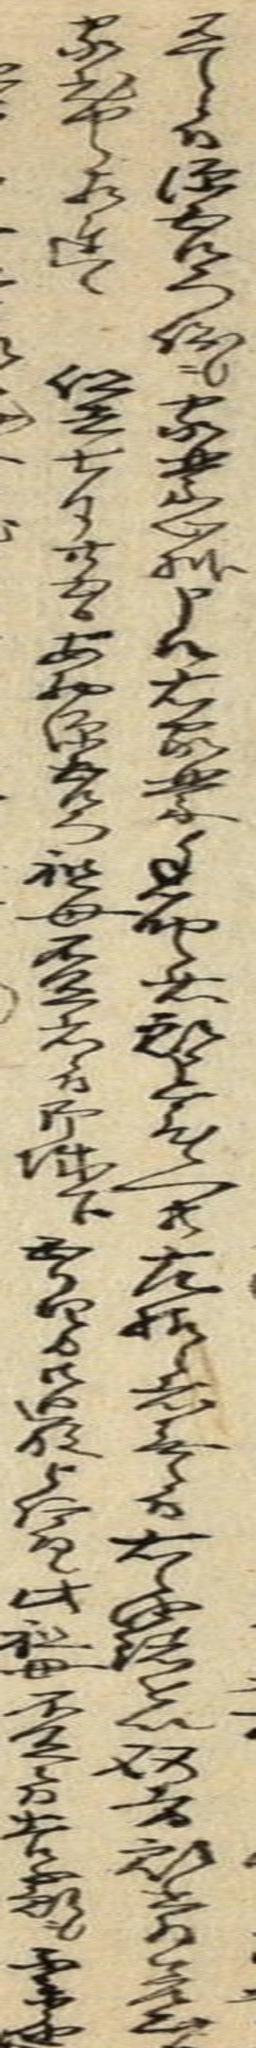家老中へ相達候但去七月廿五日安西源五左衛門祖母不宜者ニ付御城下五り四方御追放被仰付候此祖母不宜ニ付養子願も不参届趣
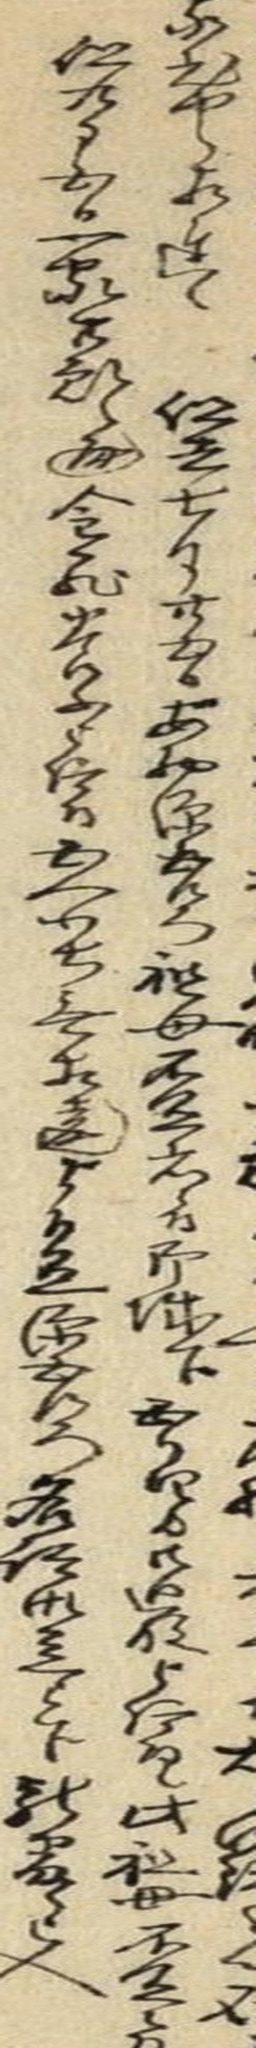但九月五日一家共願之通金蔵養子被仰付五人ふち無相違被下置源五左衛門名跡御立被下新番へ被入

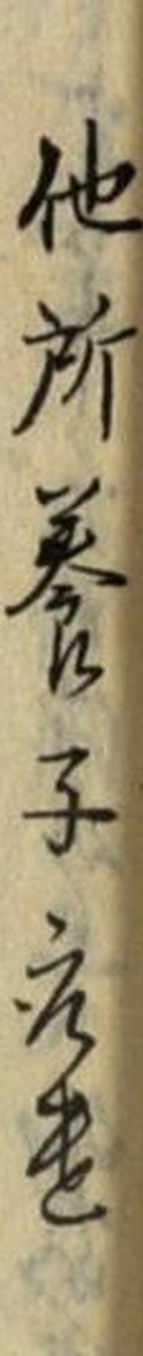他所養子取遣
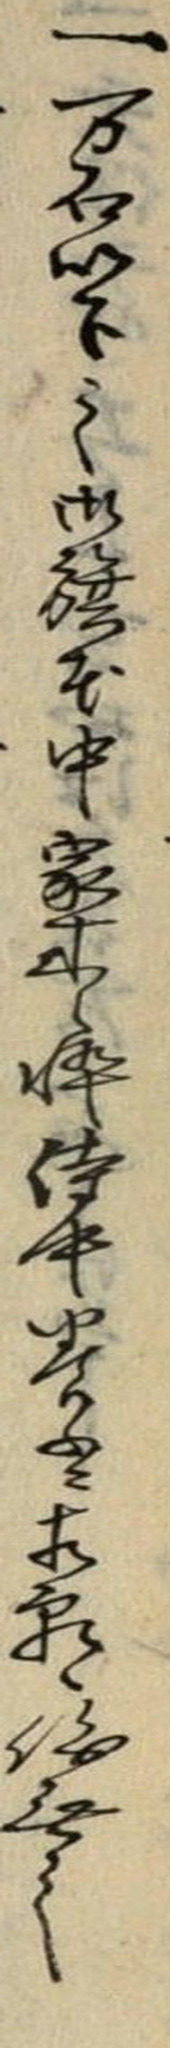一万石以下之御旗本中家来之忰侍中養子ニ相願候儀無之
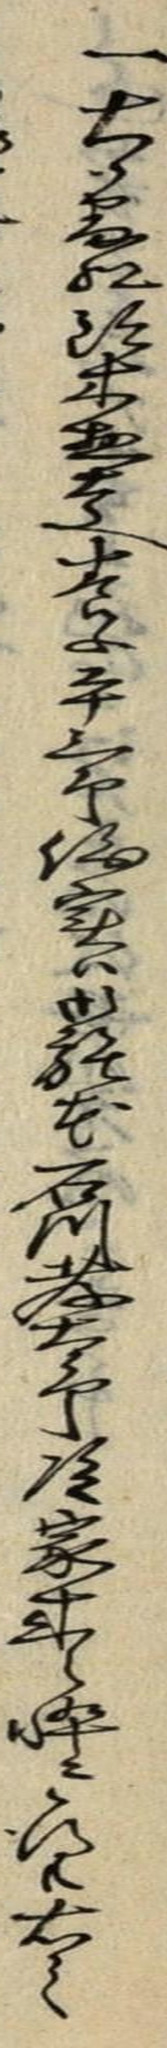一大御番組鈴木惣太夫養子平三郎儀実ハ御旗本石川孝太郎殿家来之忰ニ候得共右之
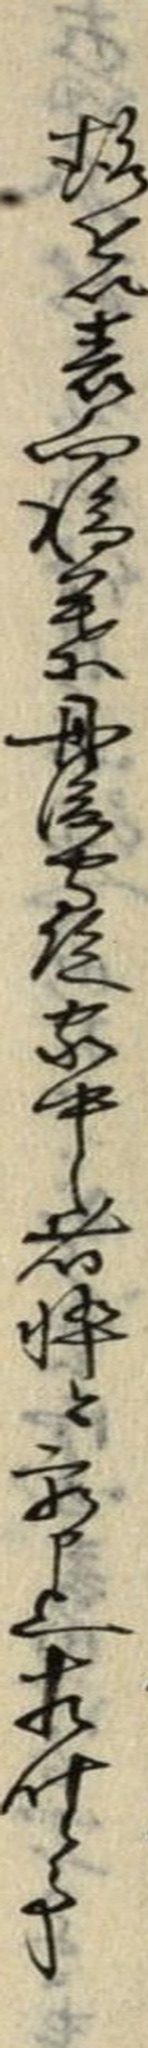趣を以表向稲葉丹後守殿家中之者忰と願申上相叶候事
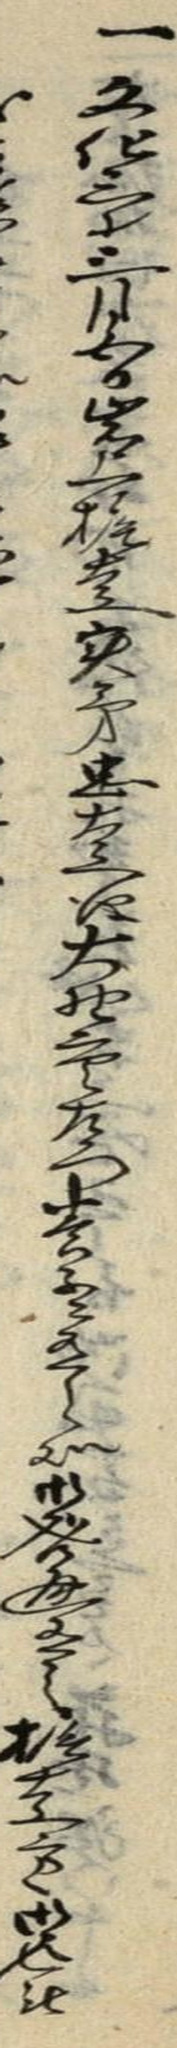一文化三寅三月五日岩上梶太夫実弟忠太夫儀大野市郎左衛門養子ニ有之候処御咎通有之梶太夫方へ御返被
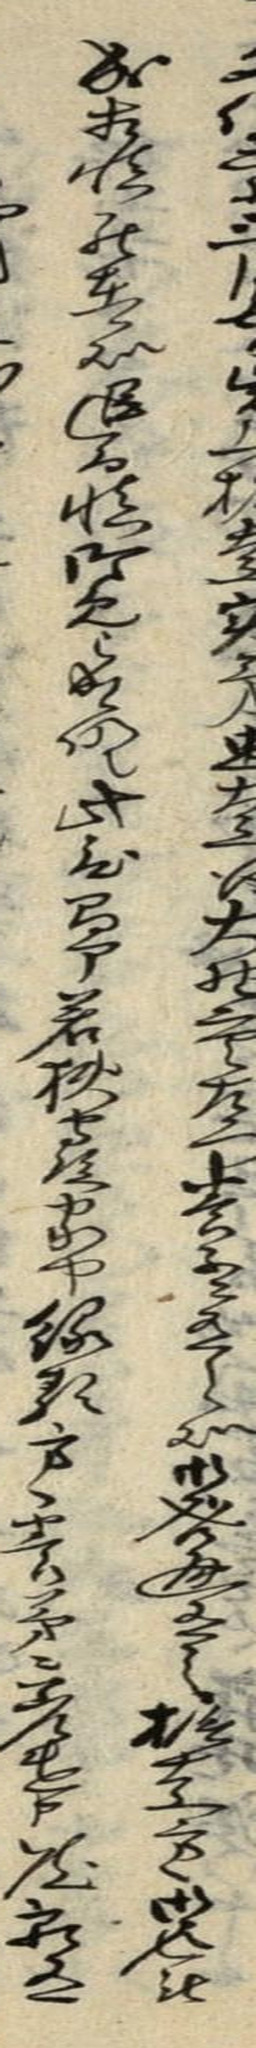成相慎罷在候処追而慎御免被成候仍之此度間部若狭守殿家中縁類方へ養弟ニ差遣申度願有
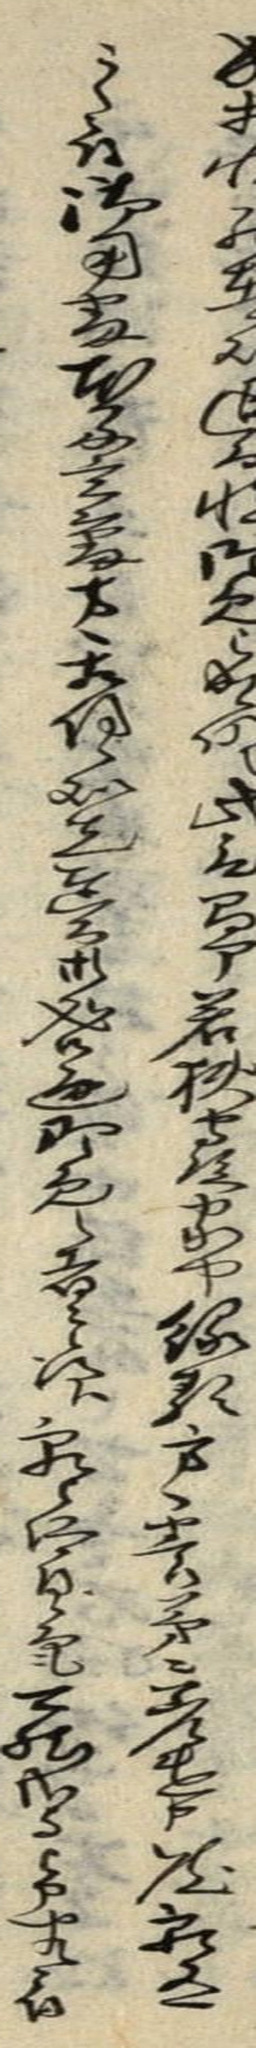之ニ付御用番本多玄蕃方へ相伺候処先達而御咎通御免之者ニ候得ハ願被仰付候而も可然哉与被申聞候ニ付
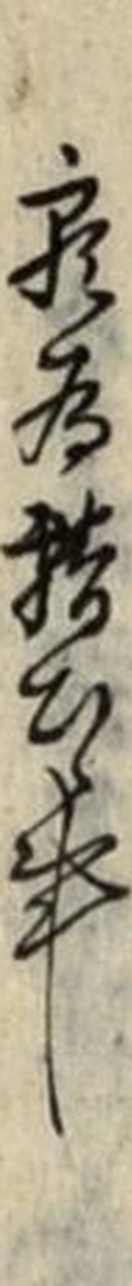願為指出候事
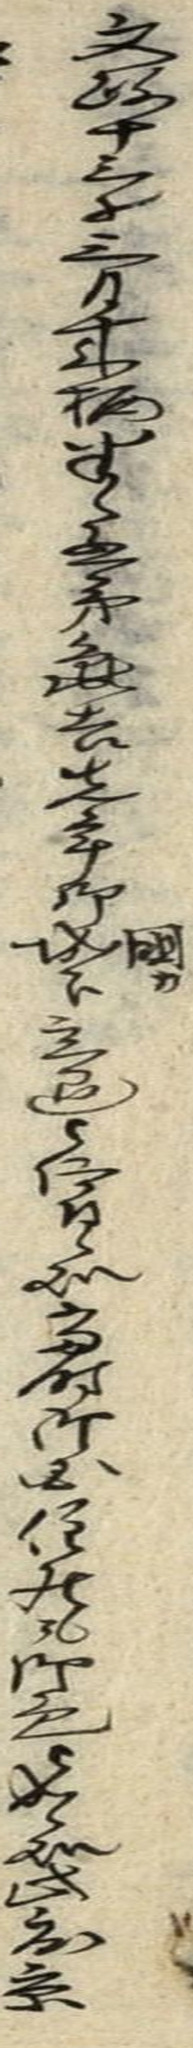一文政十三寅三月来栖半之丞弟亀吉先年御城下立退被仰付候処当時御国住居も御免被成候処此度京
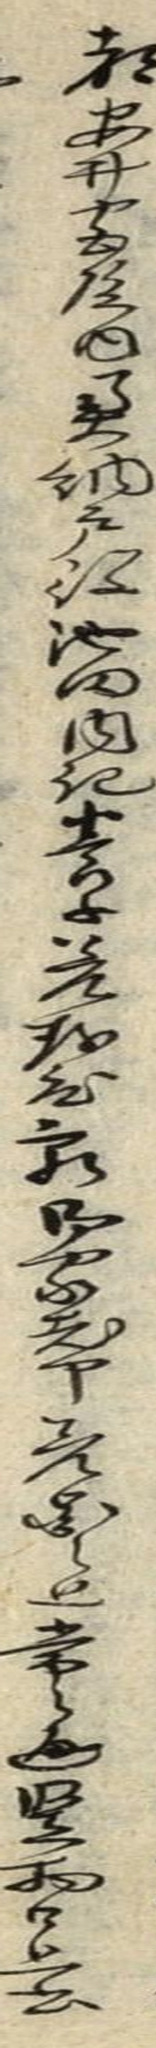都安井宮殿内奥納戸役池田内記養子差越度願御家老中差図之上常之通竪物口上書
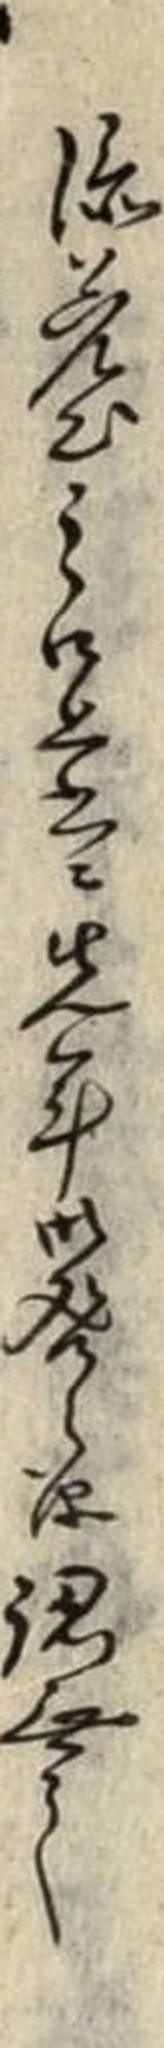添差出之口上書ニ先年御咎之儀認無之
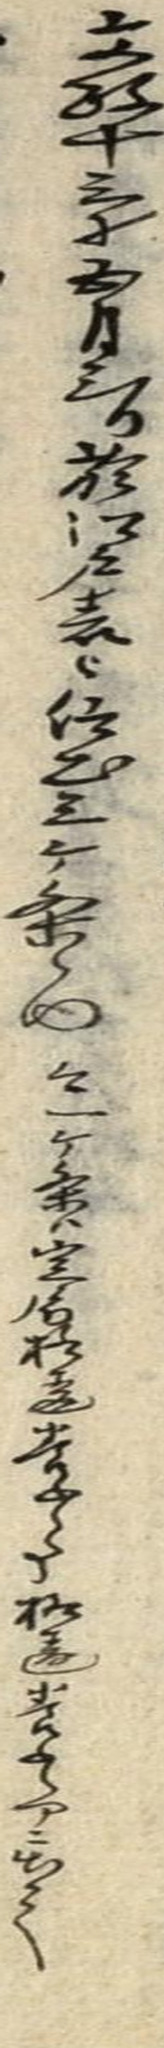一文政十三寅五月三日於江戸表被仰出三ケ条之内今一ケ条ハ定府格違養子之事格違養子之部ニ出之
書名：養子縁組之部
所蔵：福井県文書館 Fukui Prefectural Archives
